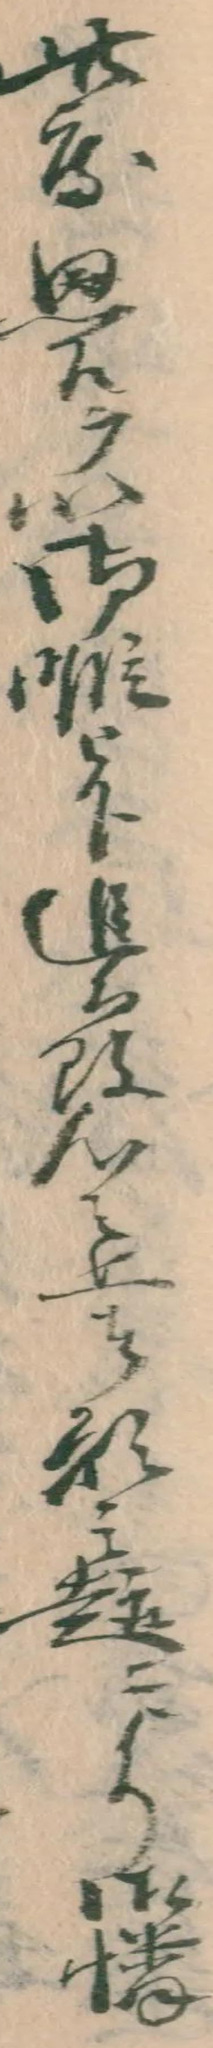此度思召ヲ以御暇被下追而改心之上は願之趣ニより御憐
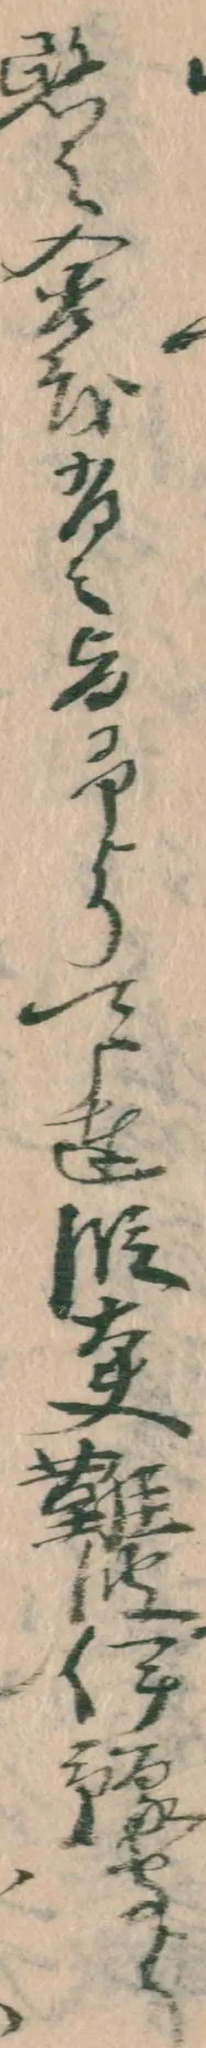憫之金茂有之旨予より可申達段大夫難波伊豫守より
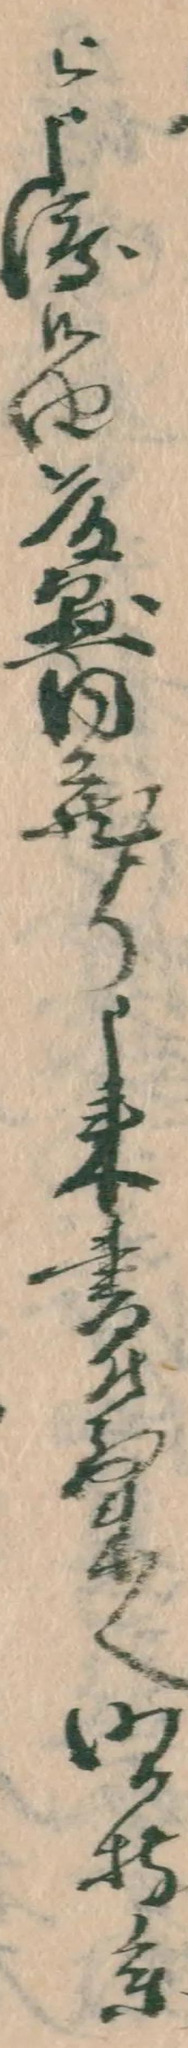被申渡候由藤岡内蔵より申来書付到来也仍而持参
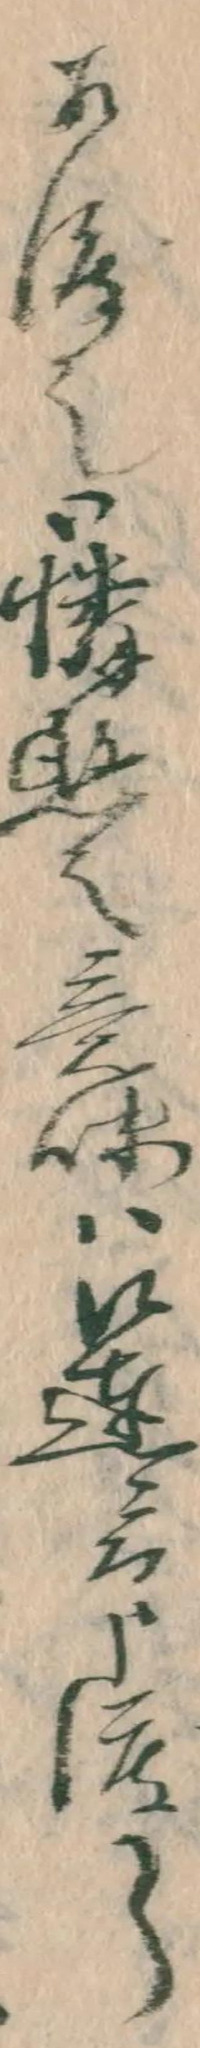相渡之御憐愍之意味ハ口達ニ而申渡了
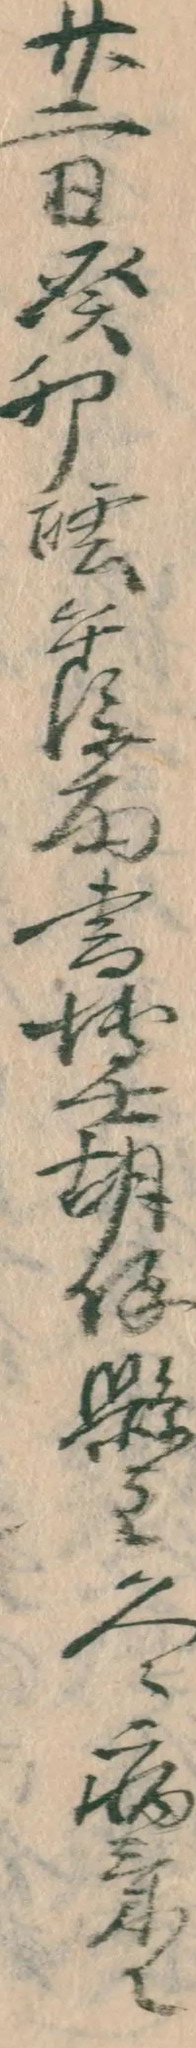廿二日癸卯曇午後雨書博士胡保縣主久々病氣之
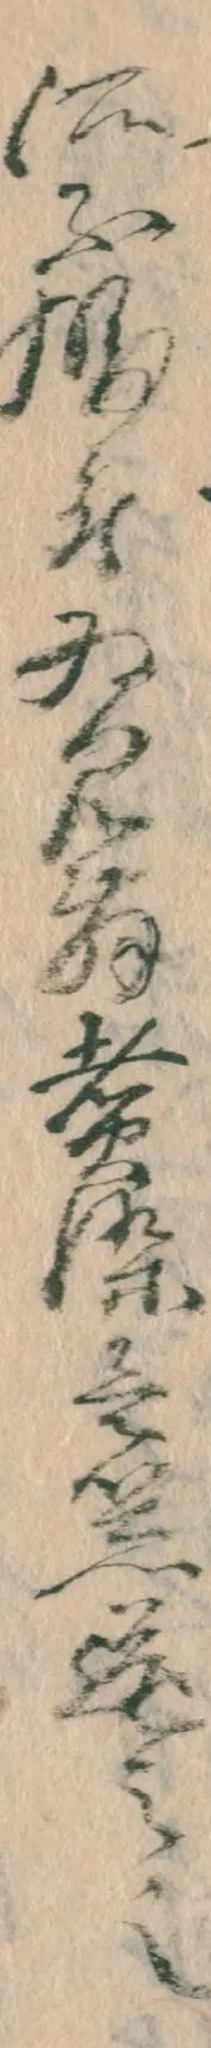所不勝ニ付為見舞煮染壱器送之也
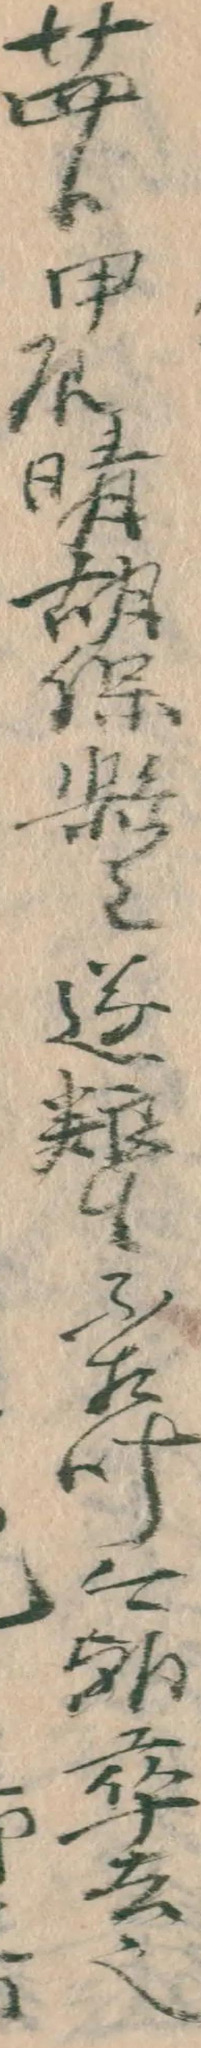廿四日甲辰晴胡保縣主遂養生不相叶今朝卒去也
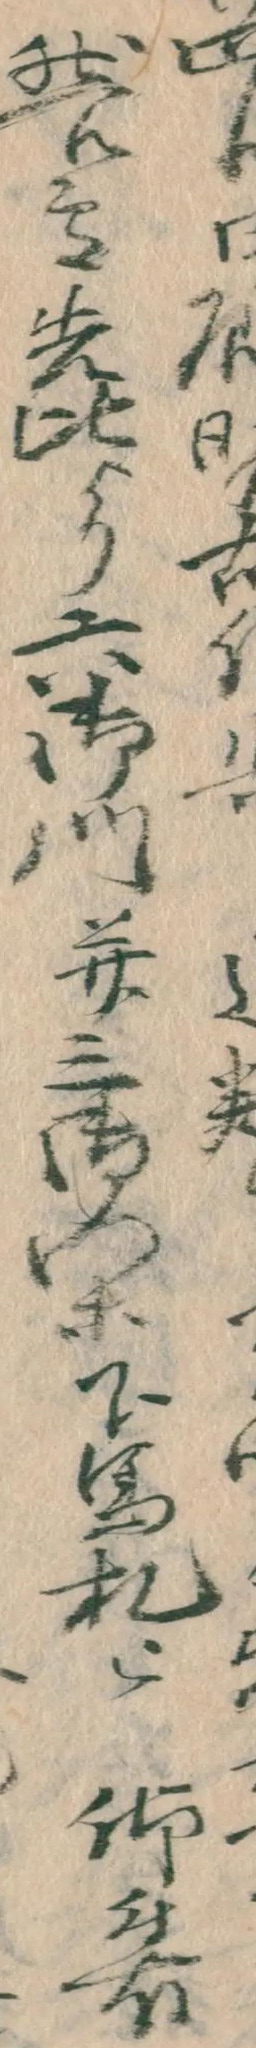然ル處先比より六御門幷三御門等下馬札被仰付有
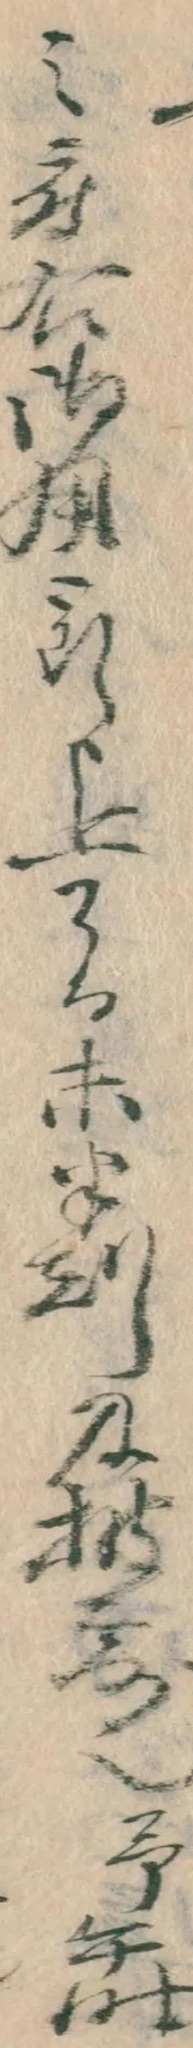之ニ付右御用所御断申上了而未半刻及披露也予午時
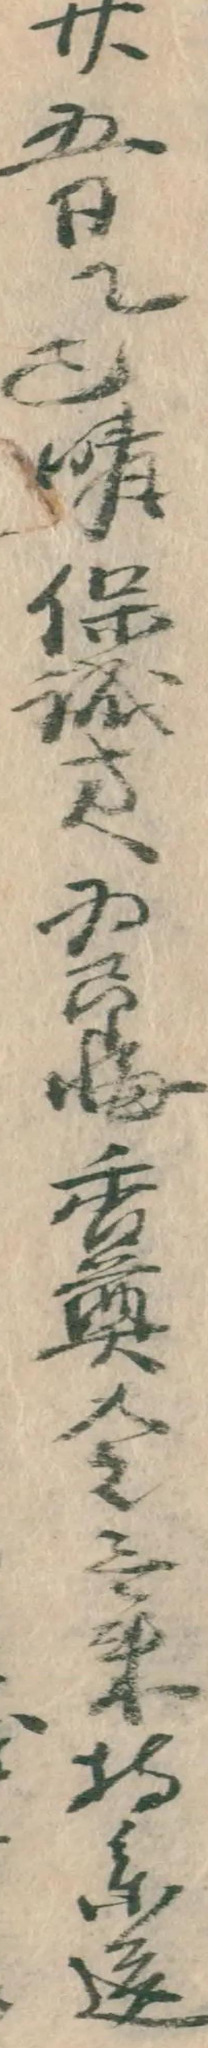廿五日乙巳晴保誠方へ為弔悔香奠金壱朱持参送
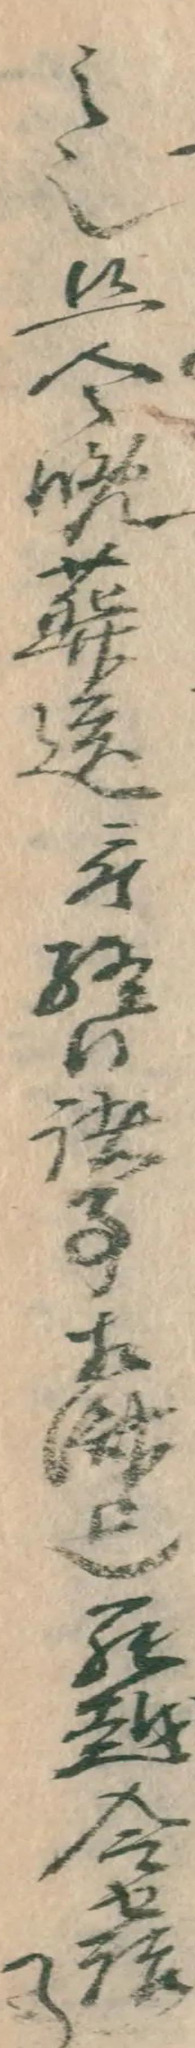之也且今晩葬送ニ付終日諸事相済迄罷越令世話了

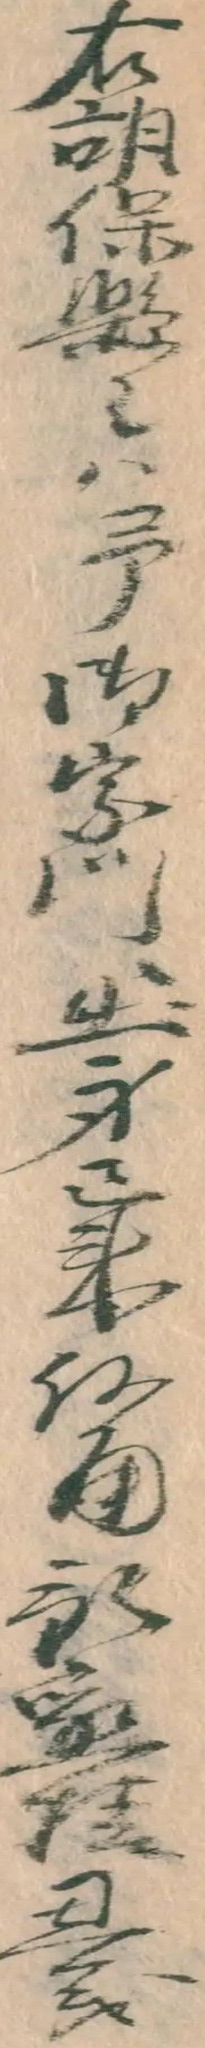右胡保縣主ハ予御家門へ出身已来何角預家情恩義
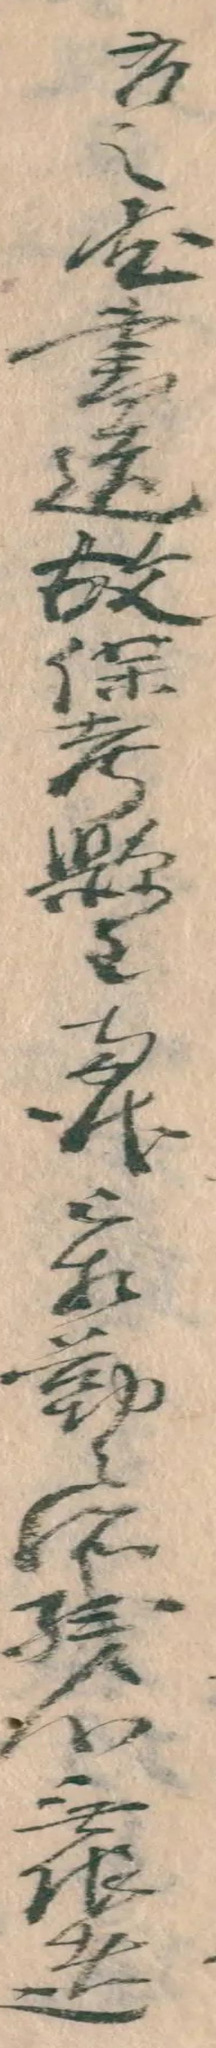有之尤書送故保考縣主両代被相勤之所残外無限者也
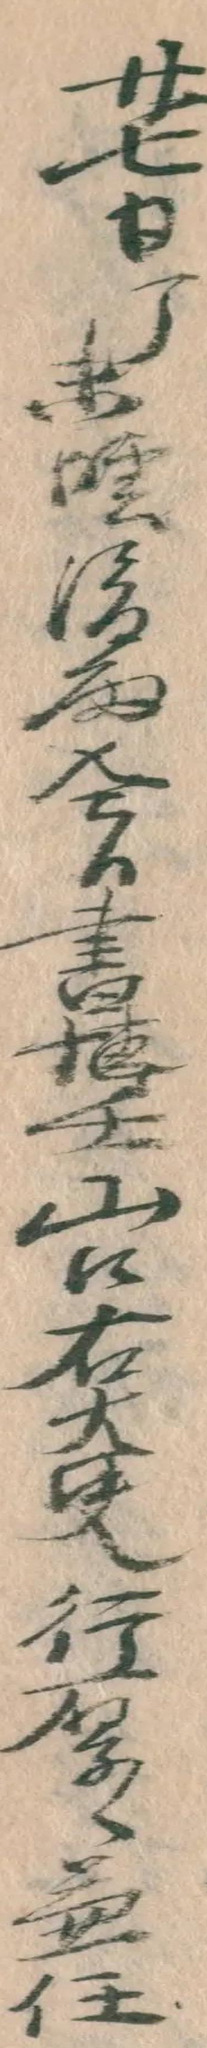廿七日丁未晴後雨今日書博士山口右大夫行厚ヘ兼任
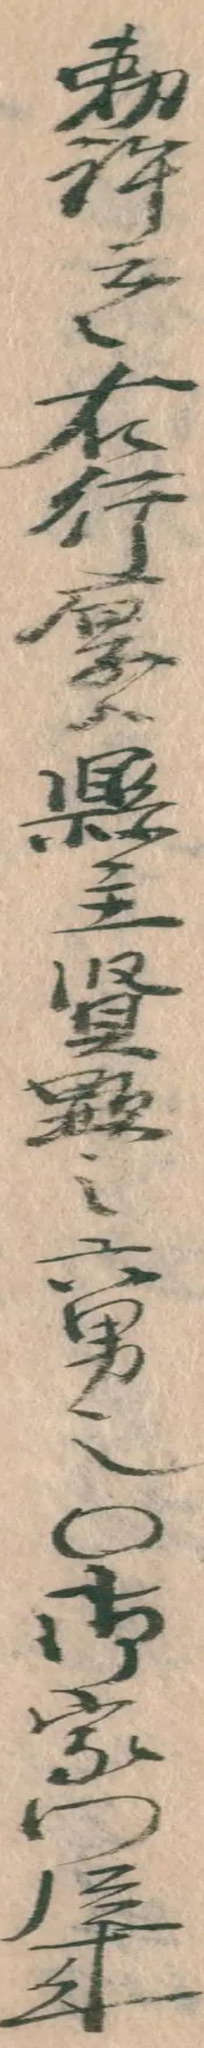勅許云〻右行厚ハ縣主賢顕之六男也○御家門従来
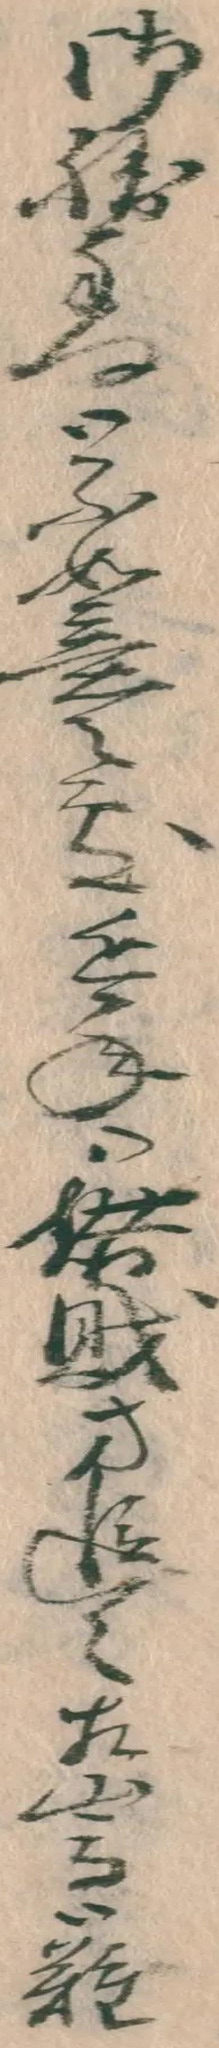御勝手向御不如意之處近年御儲財方追々相嵩御難
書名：賀茂社記録. 第67冊
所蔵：国立国会図書館 National Diet Library, JAPAN
